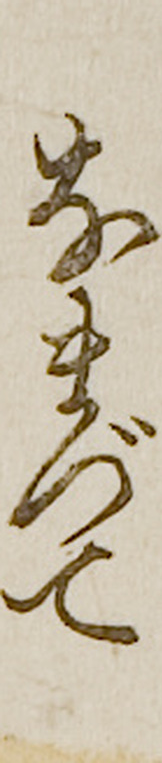なまづて
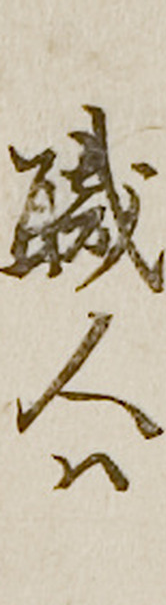職人は
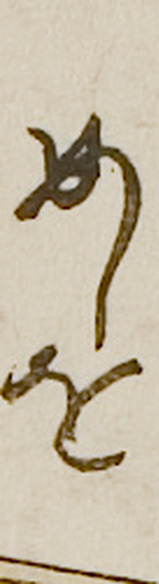めしを
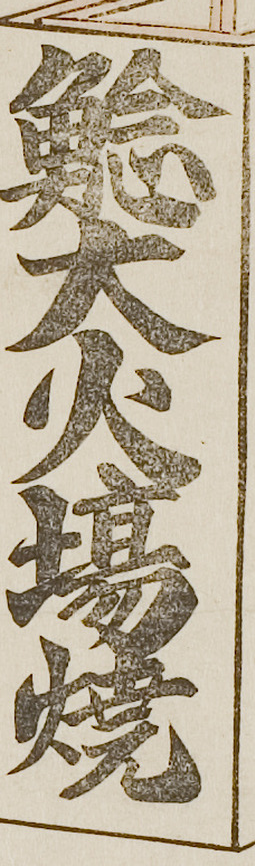鯰大火場焼
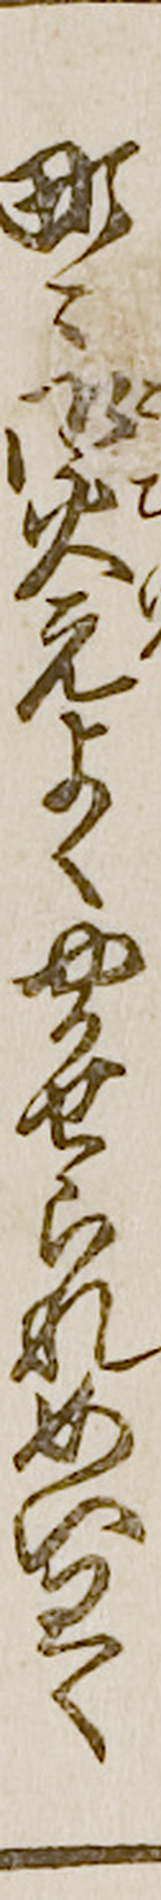町々御火元よくやかせられめいわく
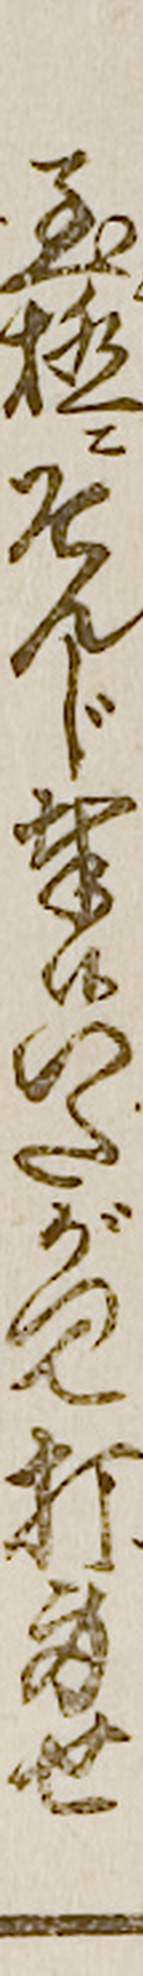至極にそんじ奉候いたがつて打身せ
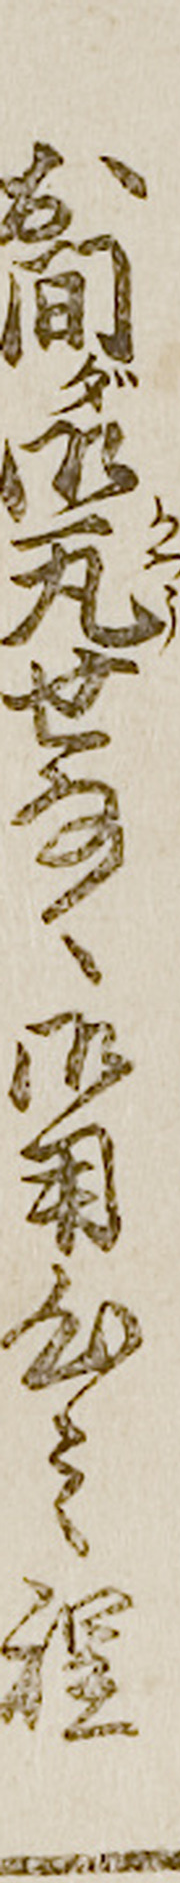お間だ御瓦せなく御用心之程
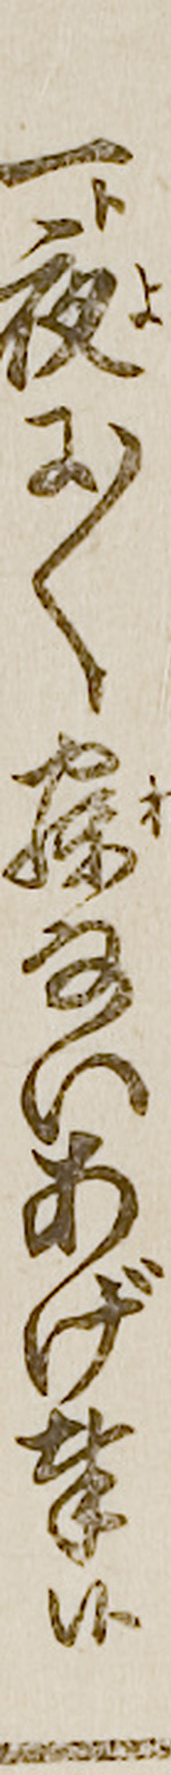一と夜に〳〵寝ないあげ奉候
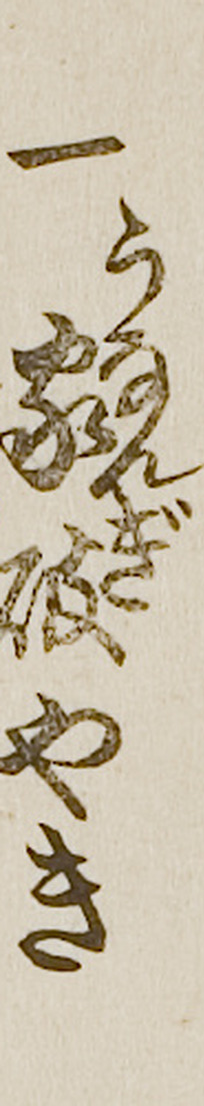一うなんぎ
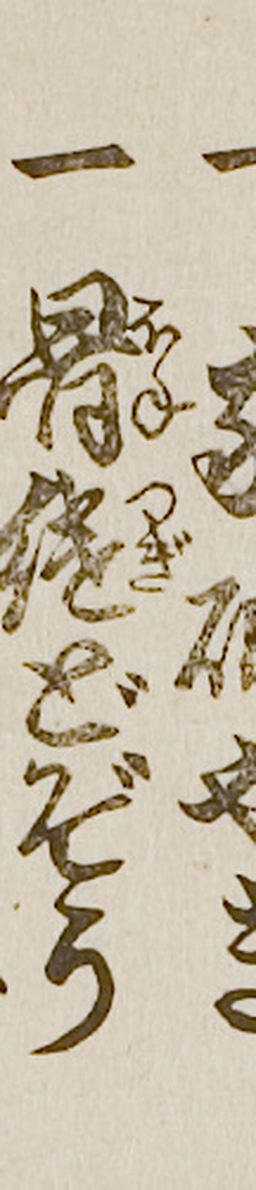一骨継どぞう
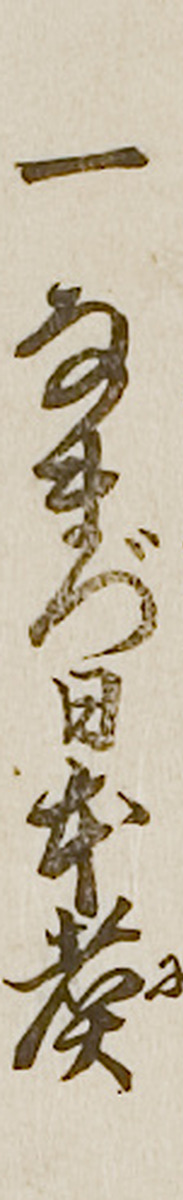一なまづ日本煮
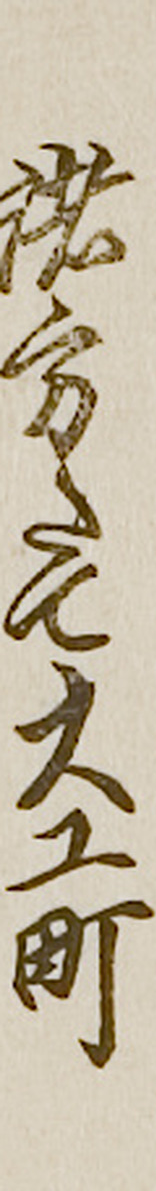諸方たて大工町
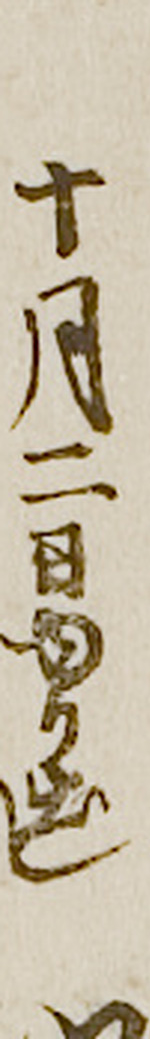十月二日ゆり出し
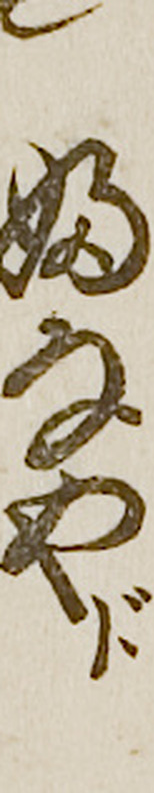ふなやど
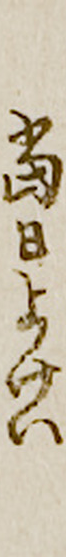当日よけい
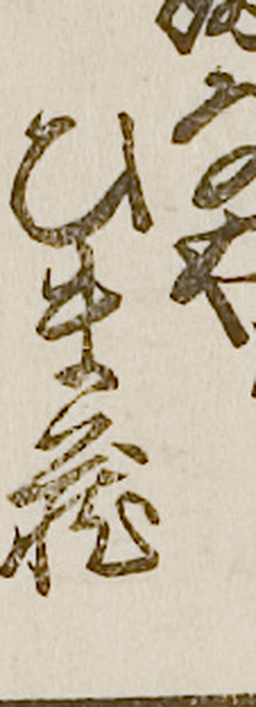ひま蔵
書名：江戸前かばやき鯰大火場焼
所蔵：東京大学総合図書館 General Library in the University of Tokyo, JAPAN
